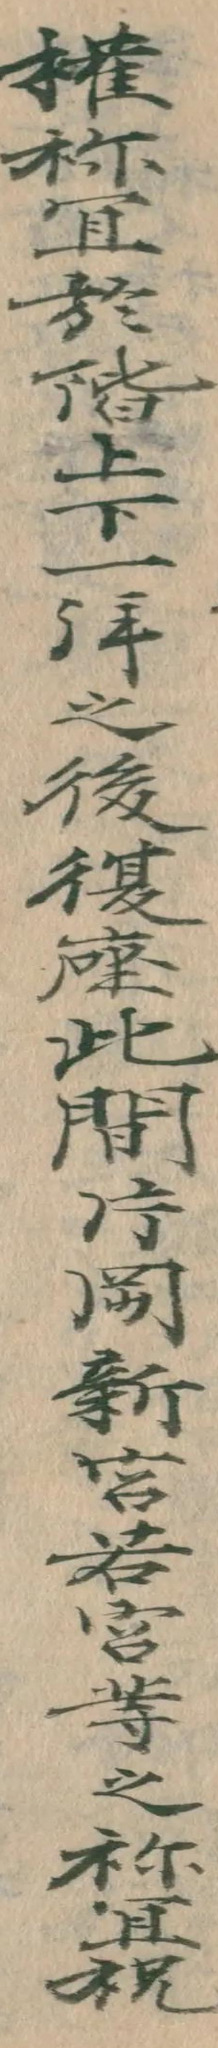権祢宜於階上下一拝之後復座此間片岡新宮若宮等之祢宜祝
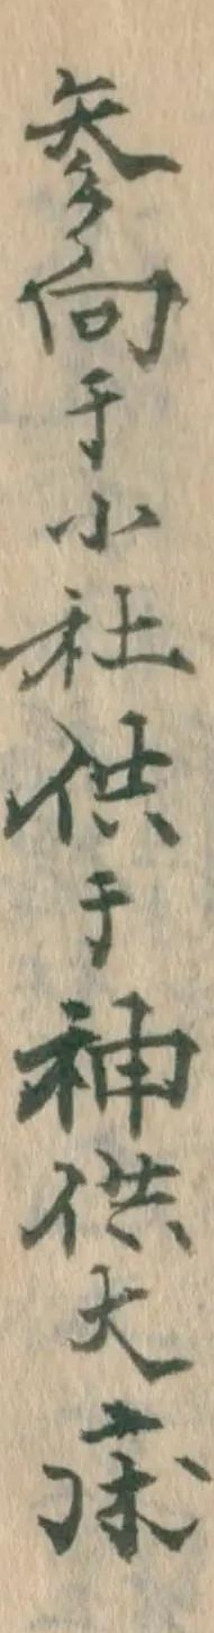参向于小社供于神供大床
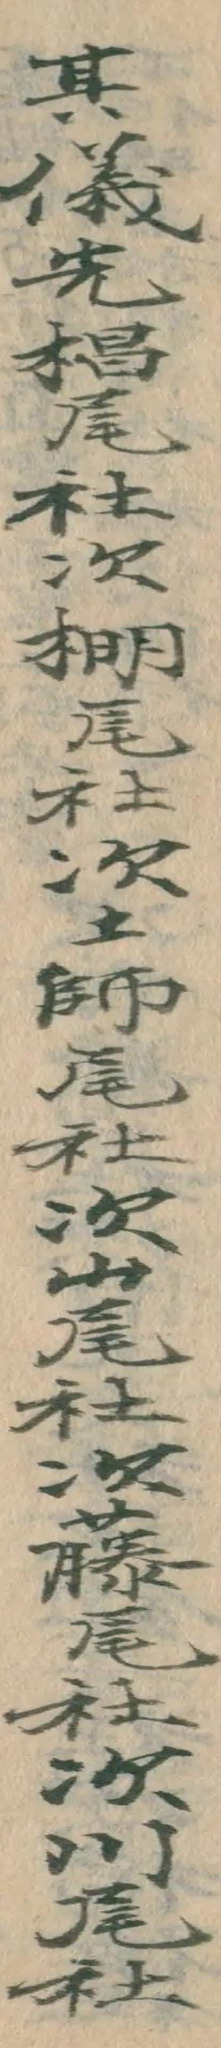其儀先椙尾社次棚尾社次土師尾社次山尾社次藤尾社次川尾社

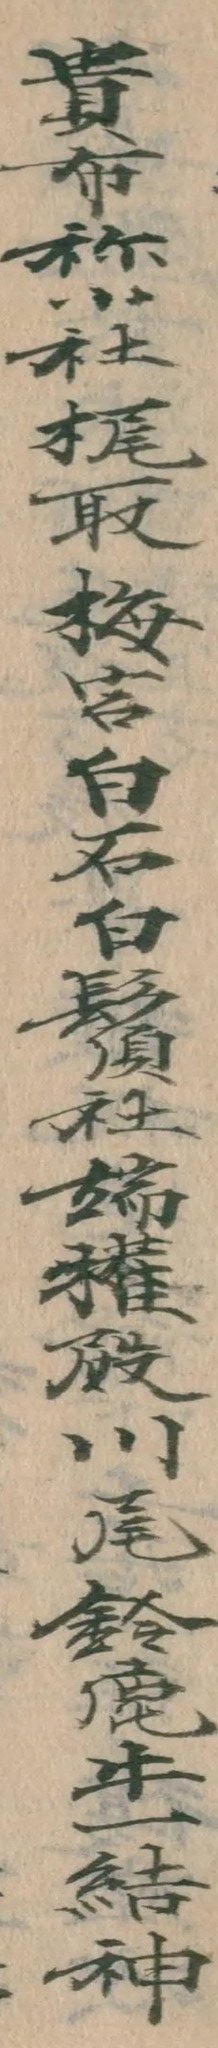貴ふね小社梶取梅宮白石白鬚社端権殿川尾鈴鹿牛一結神
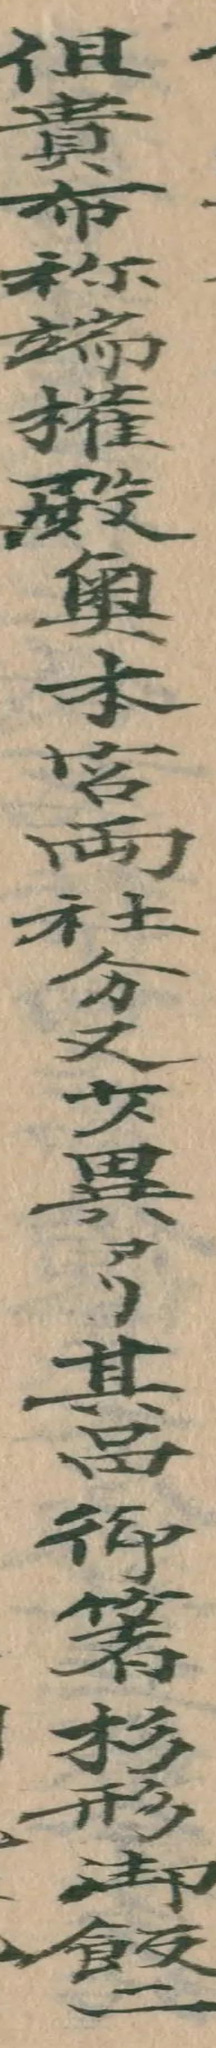但貴ふね端権殿奥本宮両社分又少異アリ其品御箸杉形御飯二
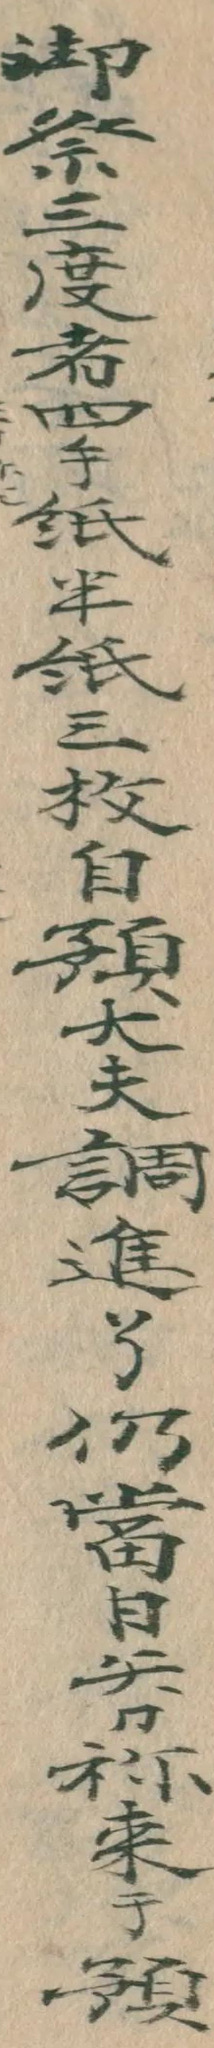御祭三度者四手紙半紙三枚自預大夫調進了仍当日矢刀祢来于預
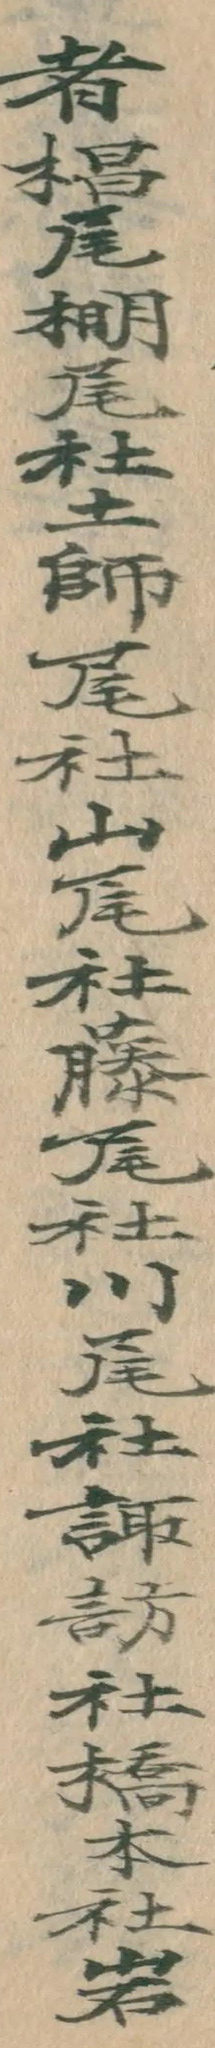者椙尾棚尾社土師尾社山尾社藤尾社川尾社諏訪社橋本社岩
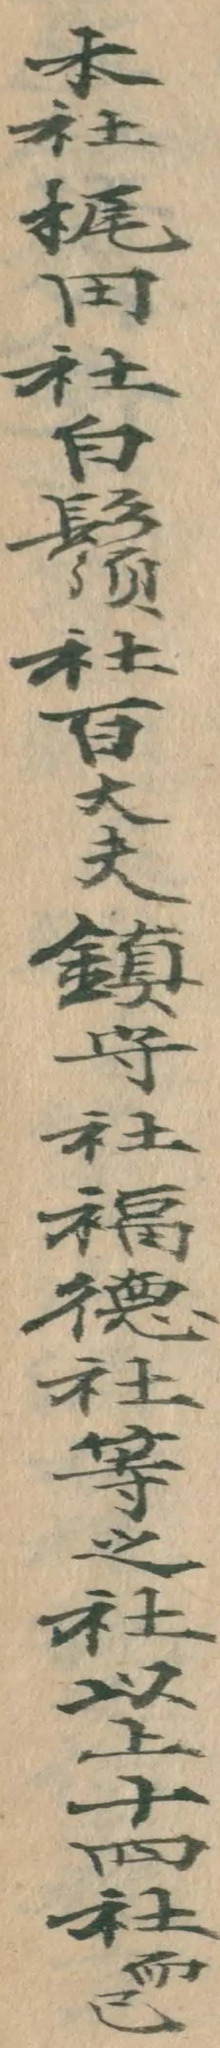本社梶田社白鬚社百大夫鎮守社福徳社等之社以上十四社而已

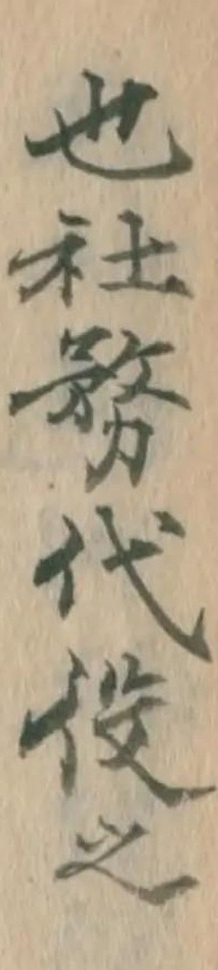也社務代役之
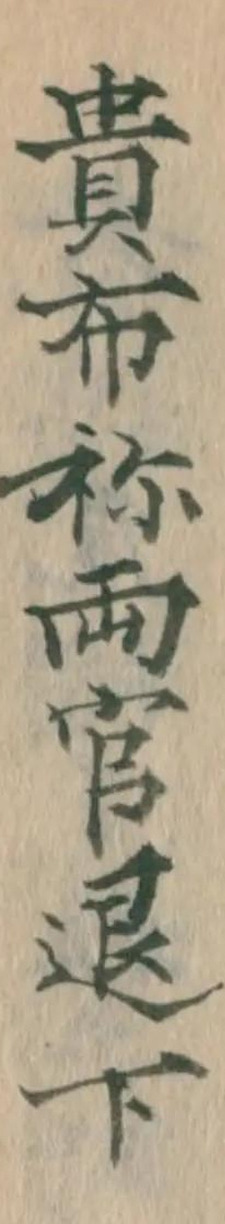貴ふね両官退下
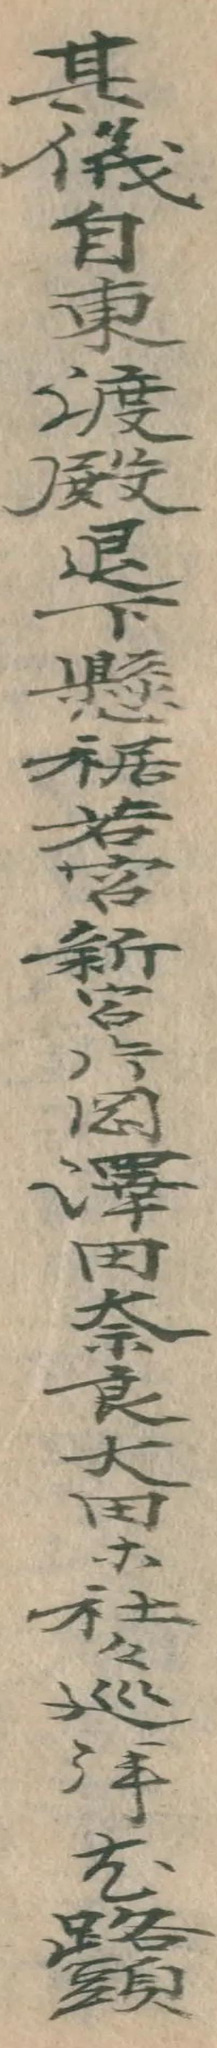其儀自東渡殿退下懸裾若宮新宮片岡沢田奈良大田等社々巡拝尤路頭
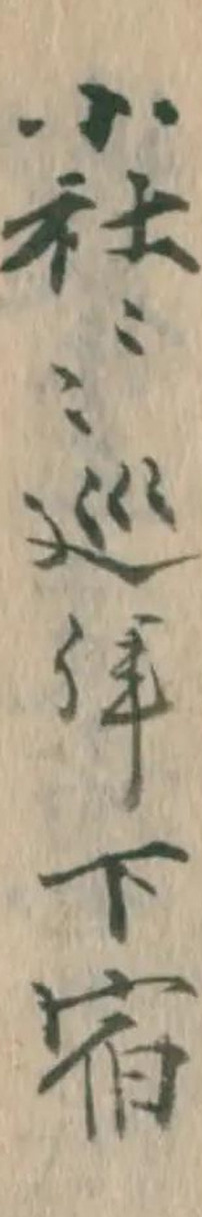小社々々巡拝下宿
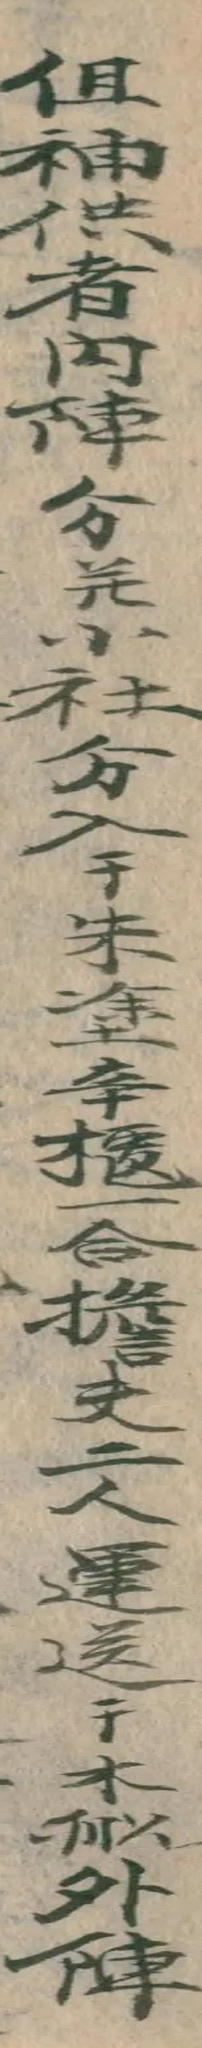但神供者内陣分并小社分入于朱塗辛櫃一合担夫二人運送于木舩外陣
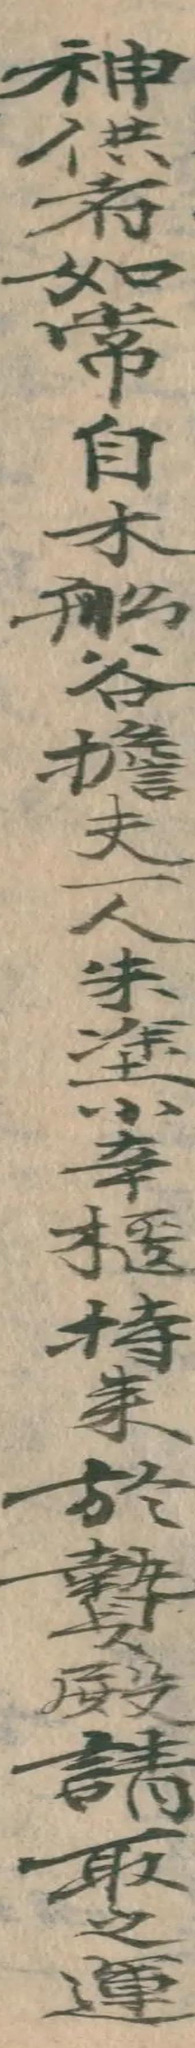神供者如常自木船谷担夫一人朱塗小辛櫃持来於贄殿請取之運
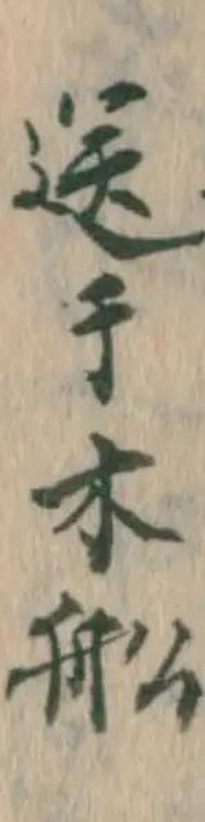送于木船
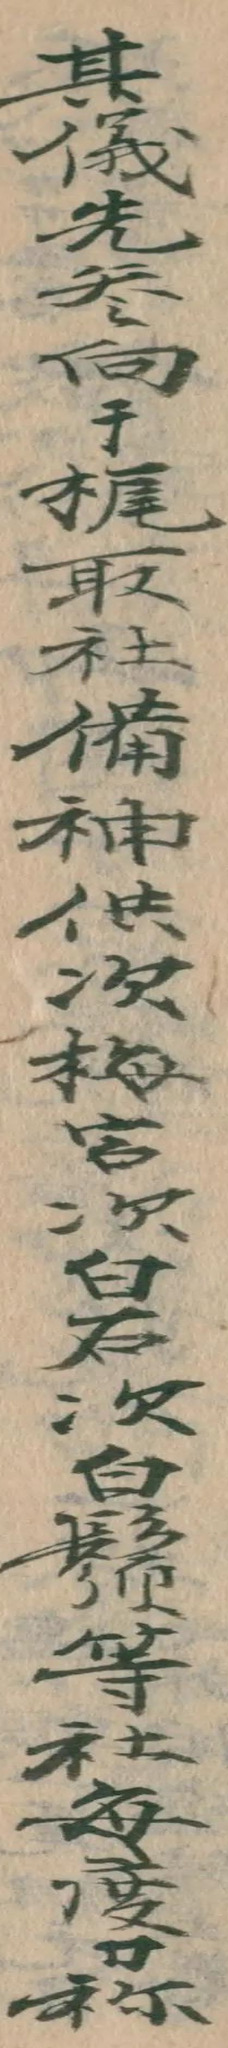其儀先参向于梶取社備神供次梅宮次白石次白鬚等社毎度刀祢
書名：賀茂社記録. 第9冊
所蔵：国立国会図書館 National Diet Library, JAPAN
